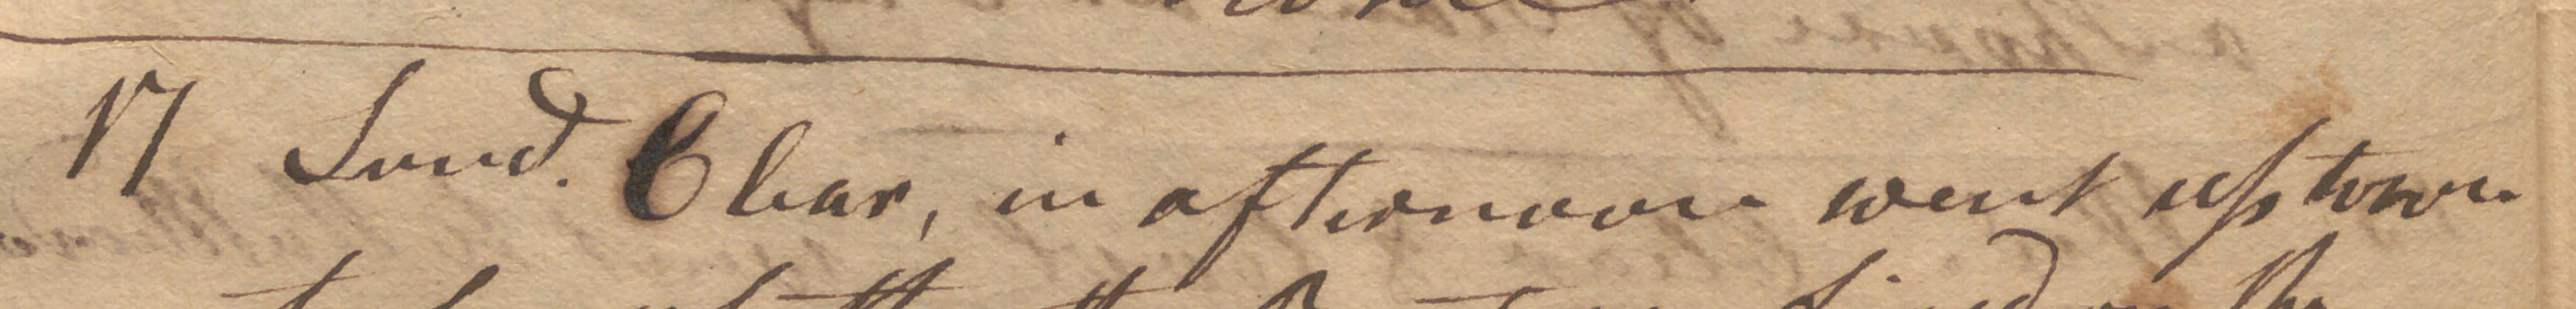17 Sund. Clear, in afternoon went up town
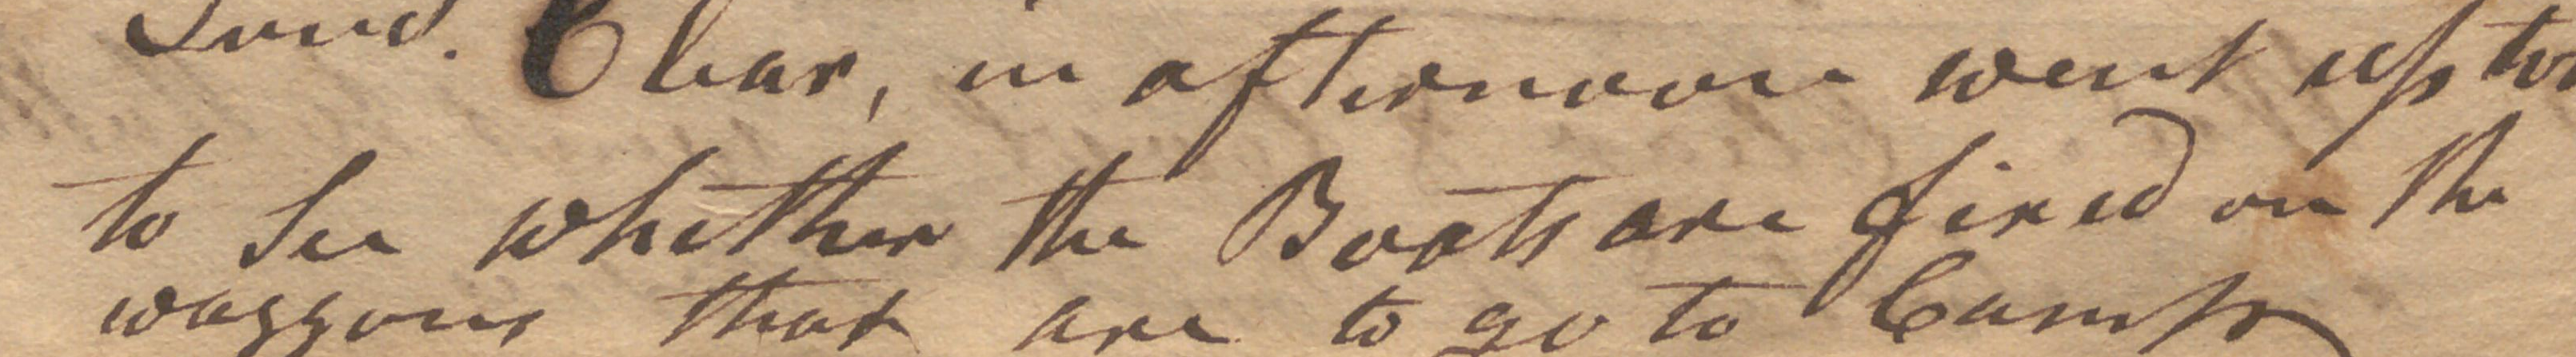to see whether the Boots are fixed on the
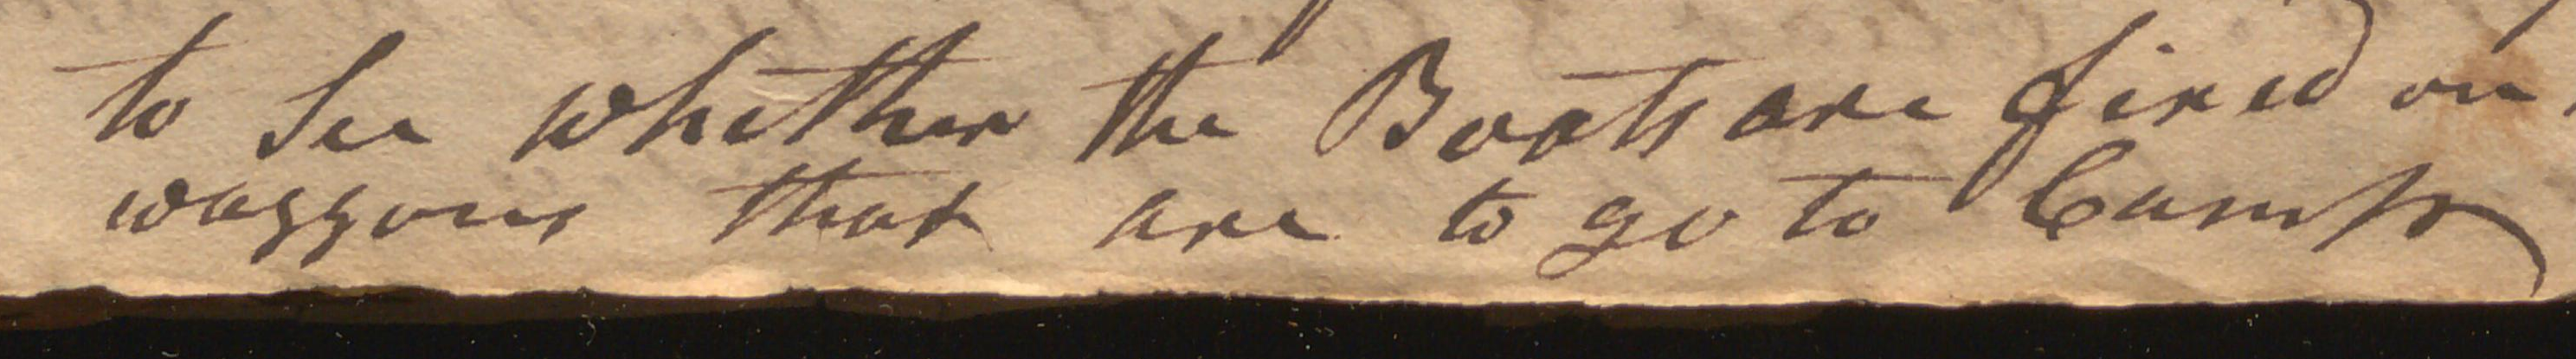waggons that are to go to Camp
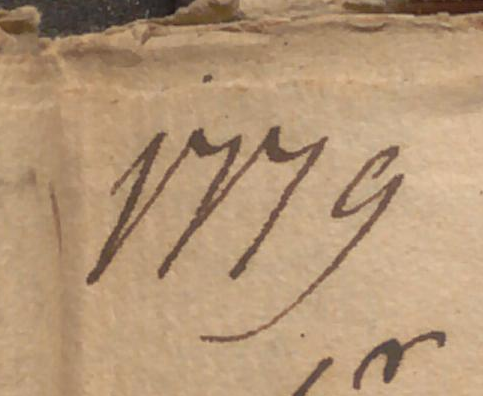1779
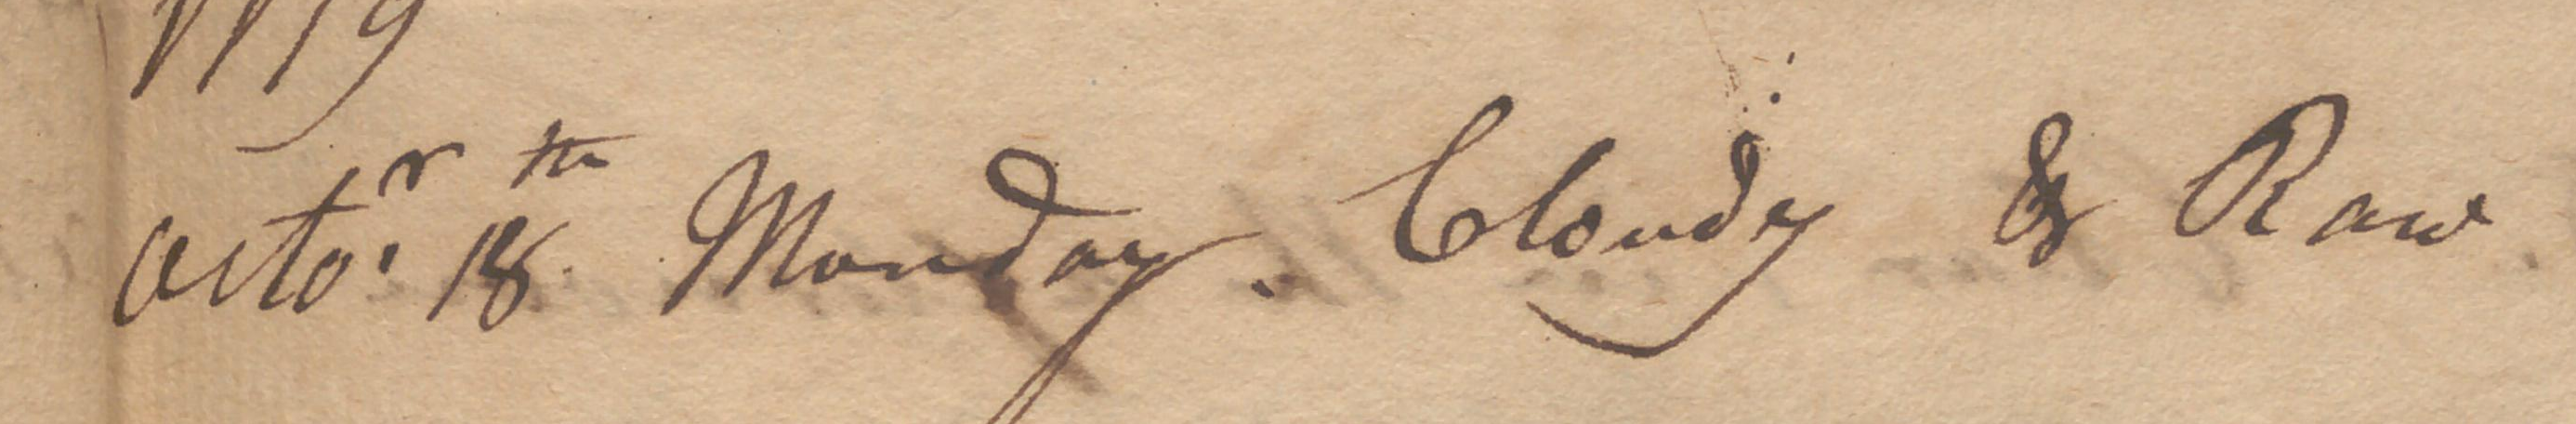Octo^r. 18^th Monday. Cloudy & Raw
